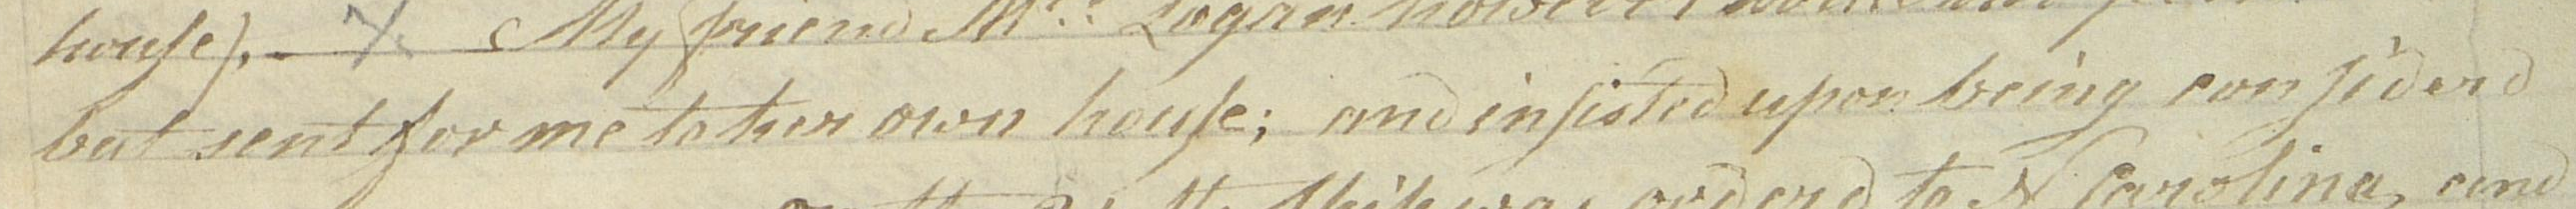but sent for me to her own house; and insisted upon being considerd
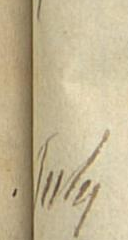July
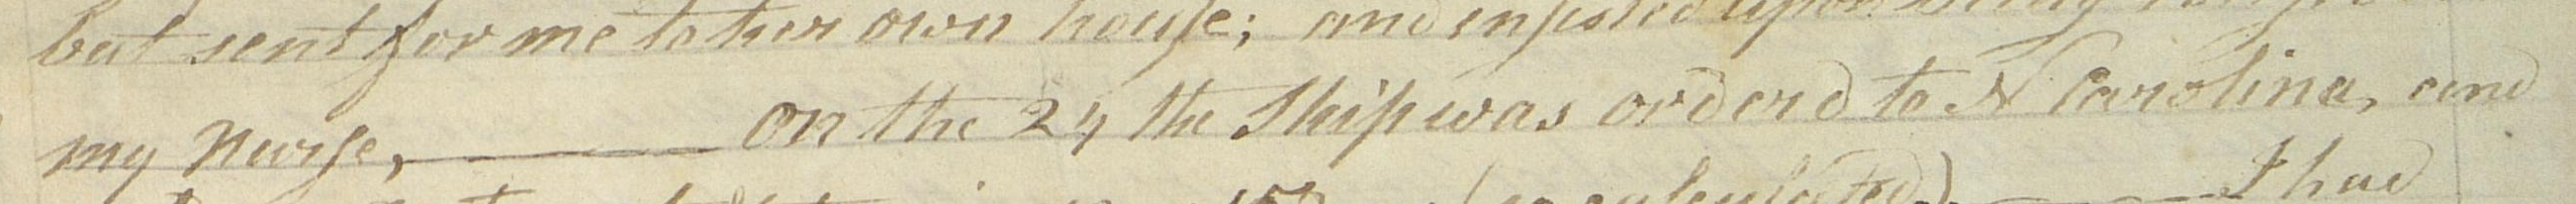my Nurse, on the 24 the Ship was orderd to N Carolina, and
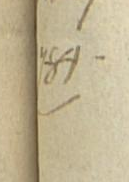1784
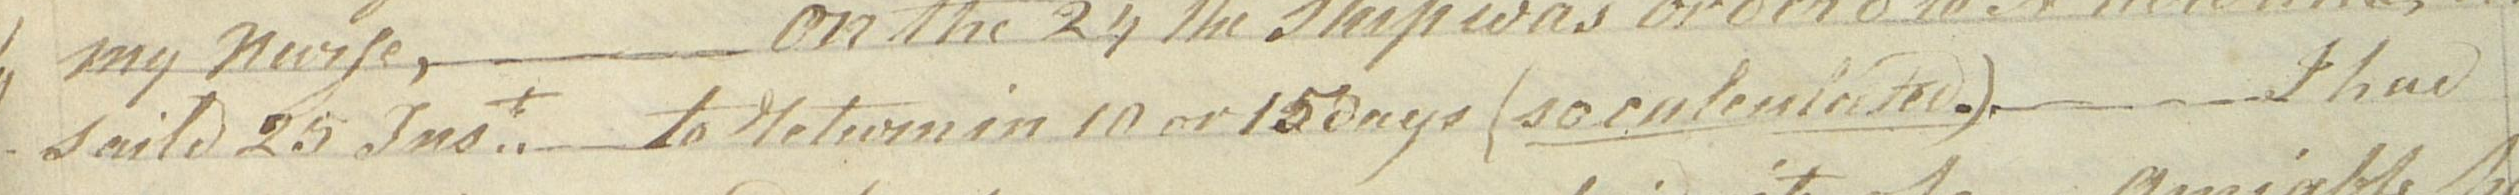saild 25 Ins^t.- to return in 10 or 15 days (so calculated.) I had
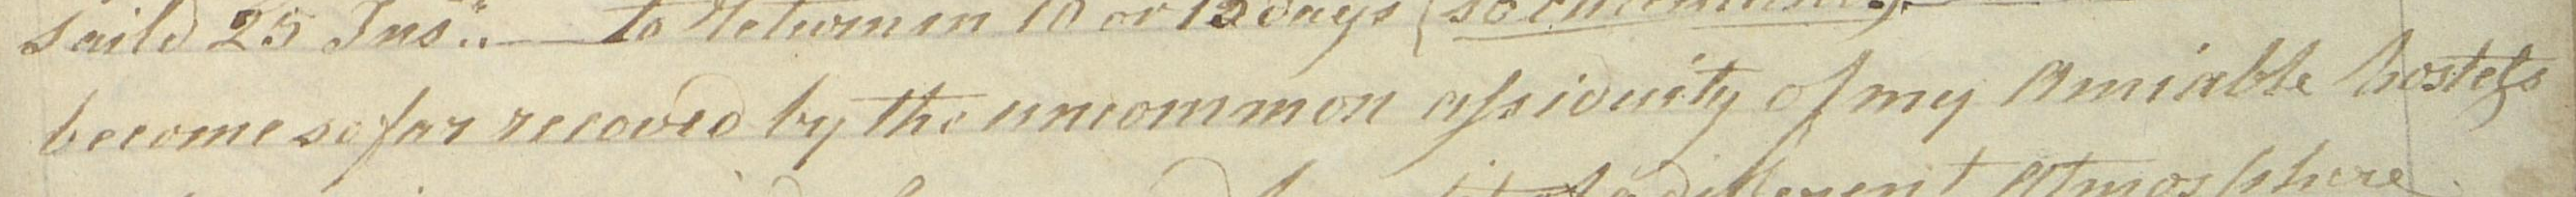became so far recoved by the uncommon assiduity of my amiable hostess
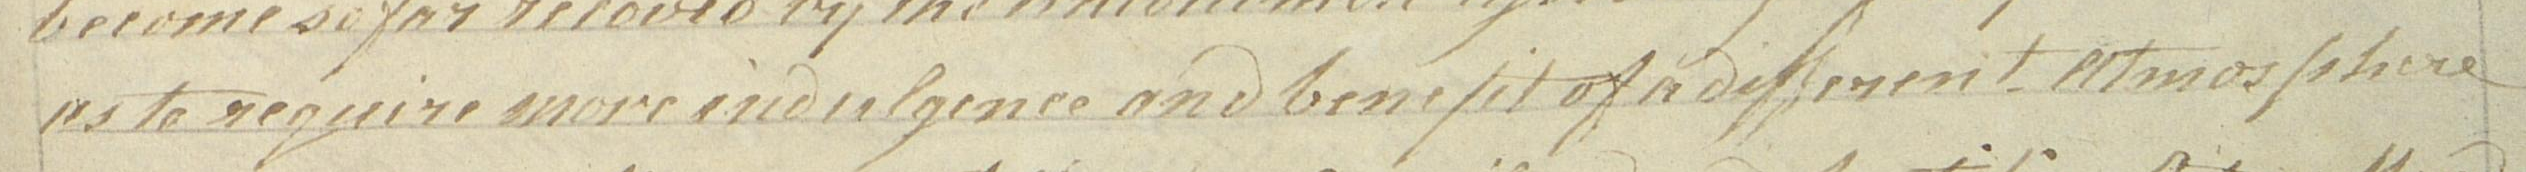as to require more indulgence and benefit of a different Atmosphere
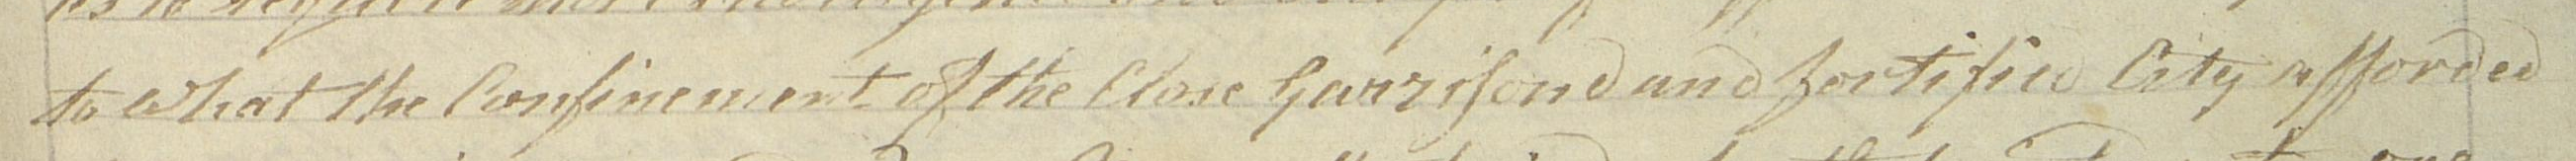to what the Confinement of the Close Garrisond and fortified City afforded
